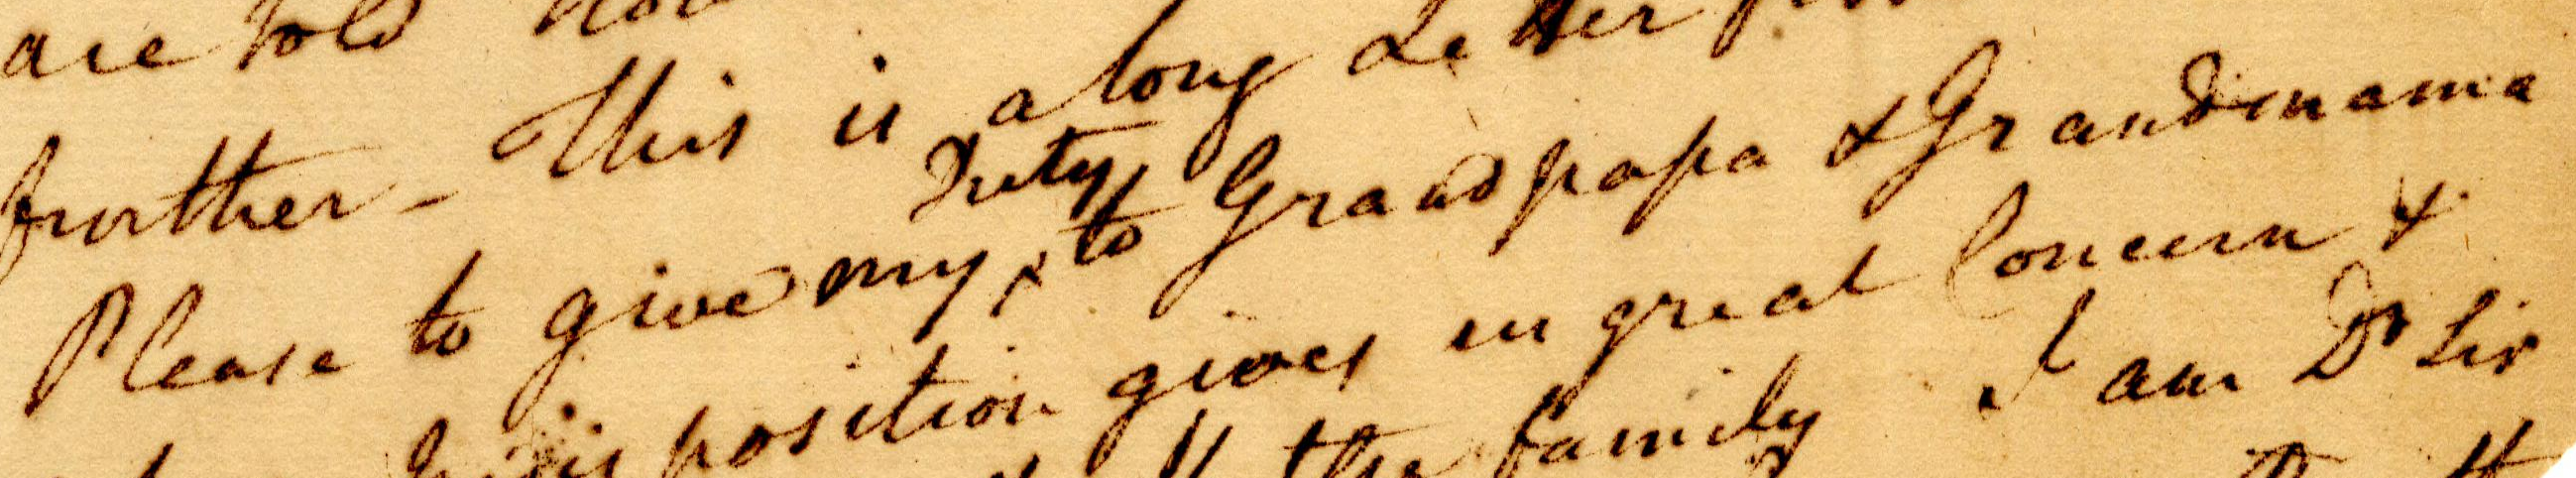Please to give my ^ to Grandpapa & Grandmama
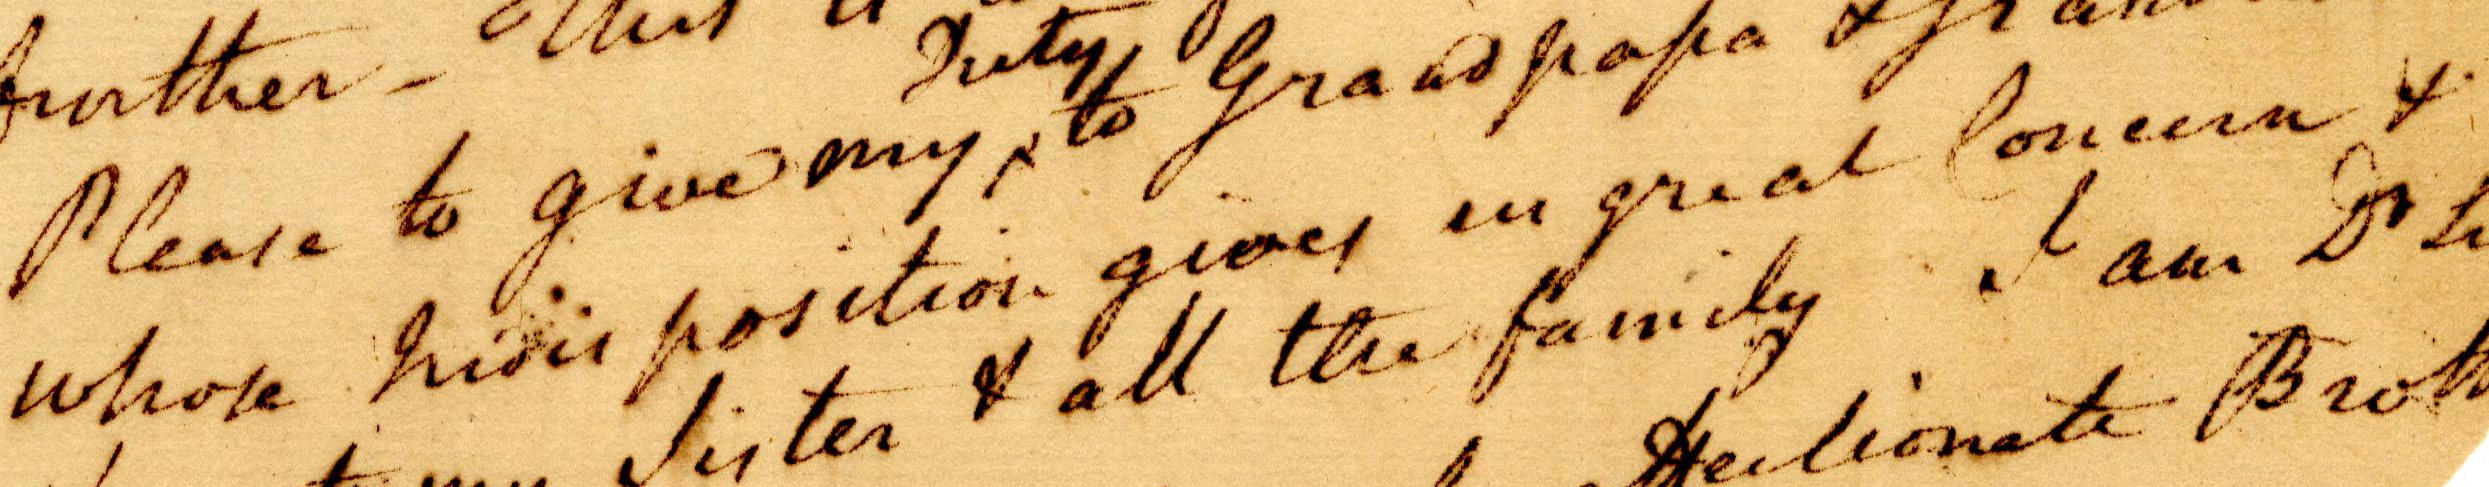whose Indisposition gives in great Concern &
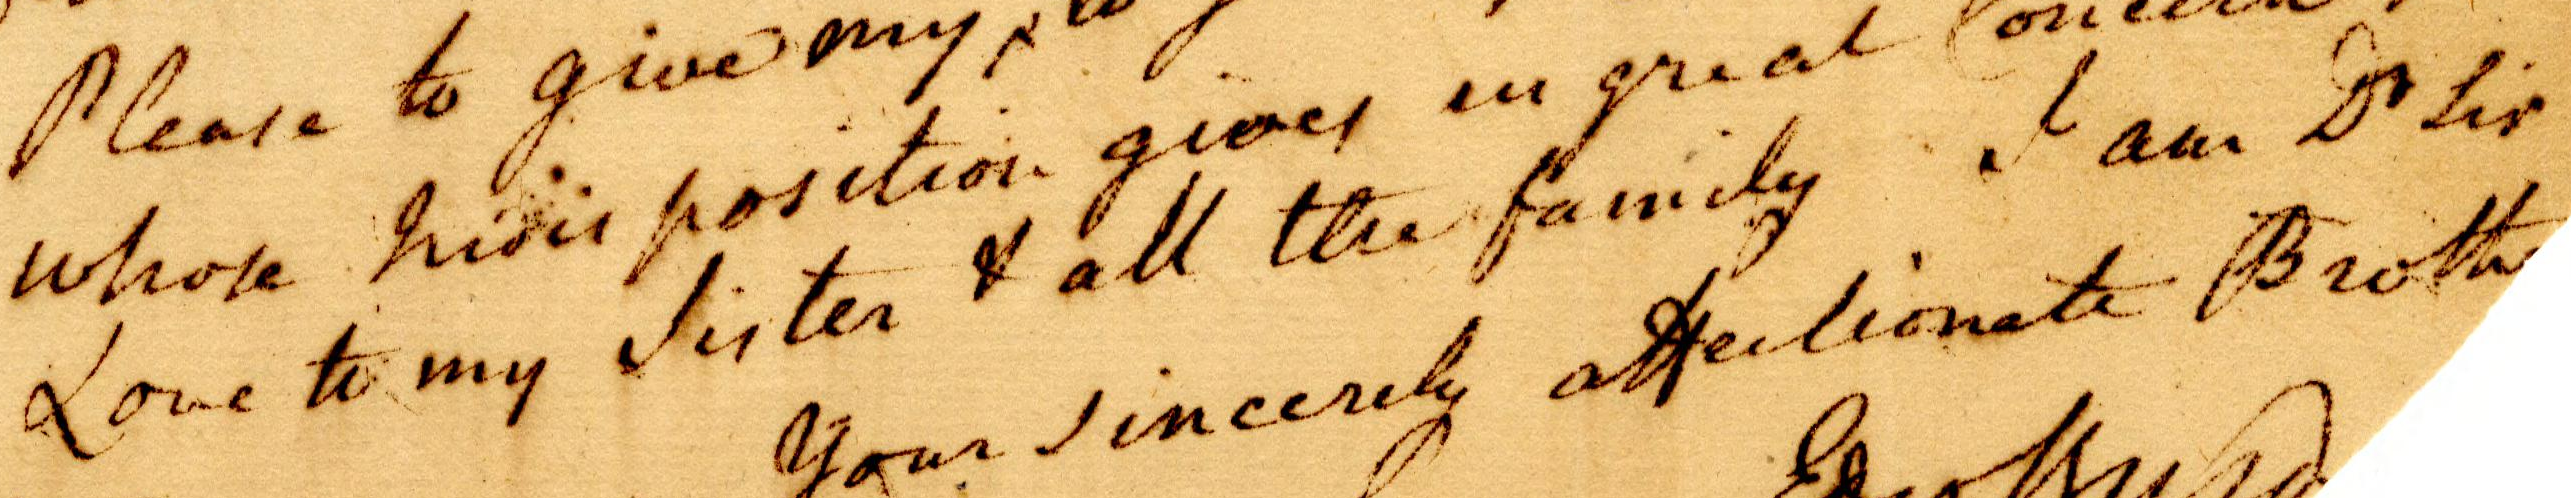Love to my Sister & all the family. I am D^r Sir
